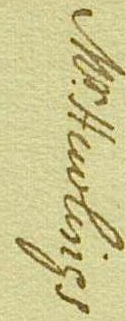M^r. Hewlings
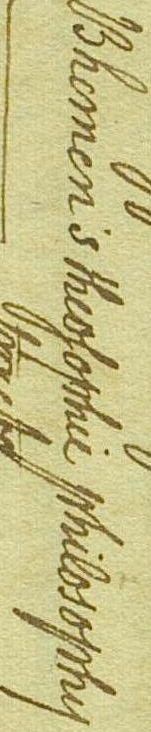Bhomen's theosophie philosophy
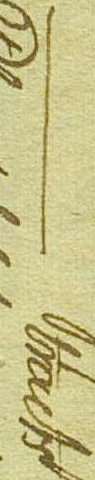--- tracts
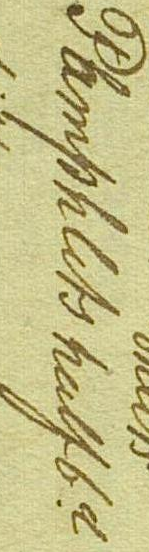Pamphlets half b^d.
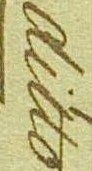ditto.
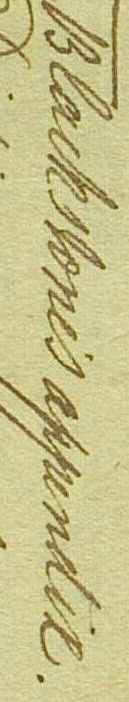Blackstone's appendix.
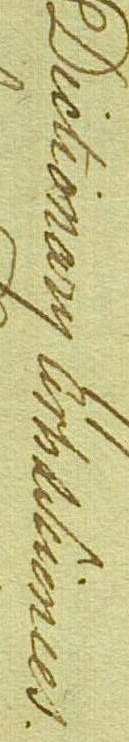Dictionary Arts & Sciences.
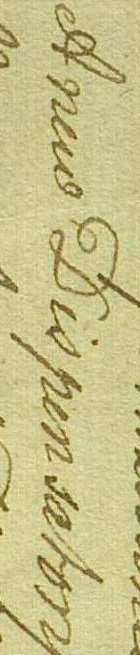A new Dispensatory.
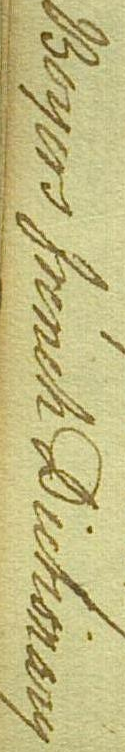Boyers french Dictionary
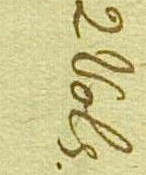2 Vols.
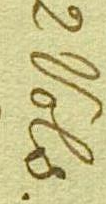2 Vols.
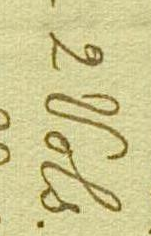2 Vols.
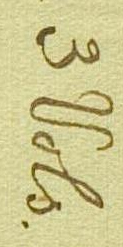3 Vols.
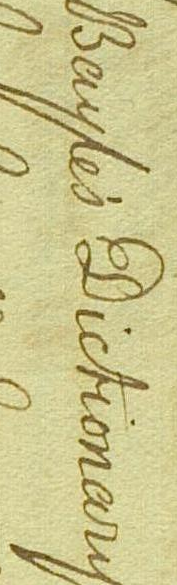Bayle's Dictionary
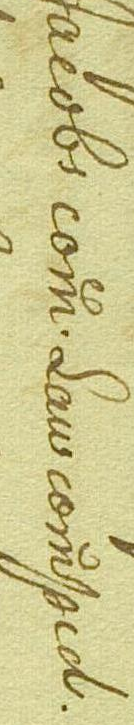Jacobs com.^e Law comped.
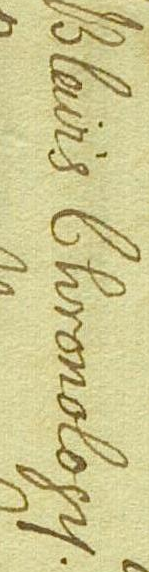Blair's Chronology.
